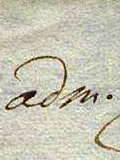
adm.
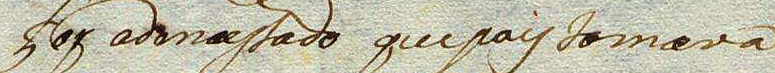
Foy admoestado que pois tomava
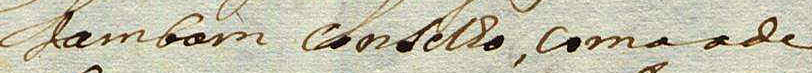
tam bom conselho, como o de
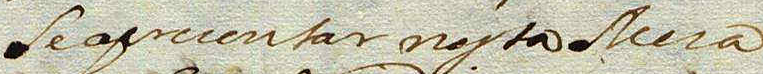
se aprezentar nesta Meza
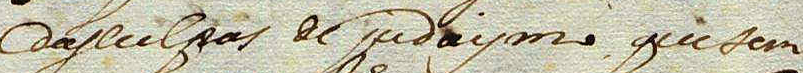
das culpas de judaismo, que tem
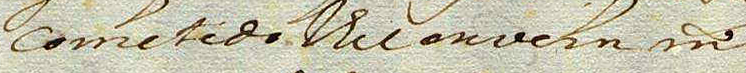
cometido lhe convem mto
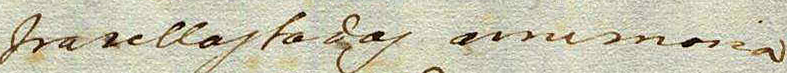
trazellas todas a memoria
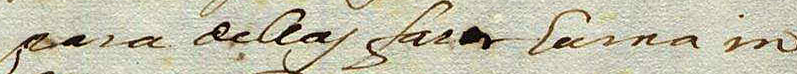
para dellas fazer huma in
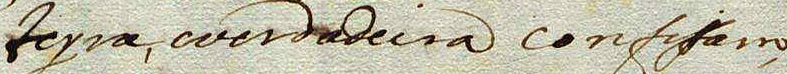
teyra, e verdadeira confissam,
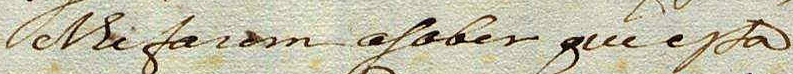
e lhe fazem a saber que esta
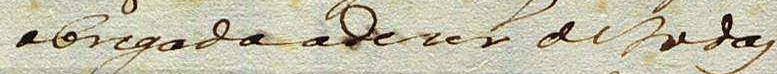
obrigado a dezer de todas
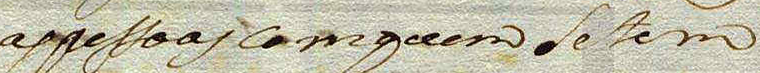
as pessoas com quem se tem
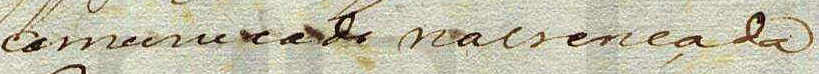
comunicado na crença da
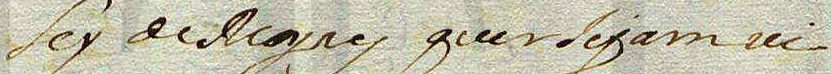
Ley de Moyzes quer sejam vi
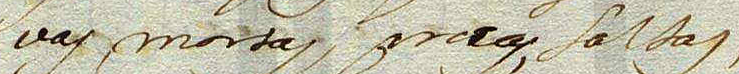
vas mortas, prezas, soltas,
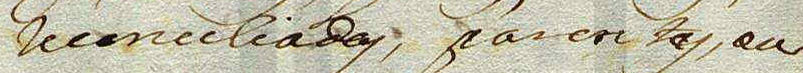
Reconçiliadas, parentas, ou
